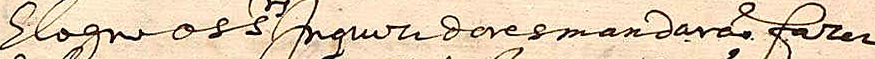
E loguo os sres Jnquizidores mandaraõ fazer
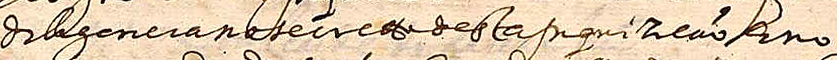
diligencia no secretto desta jnquizicaõ E no
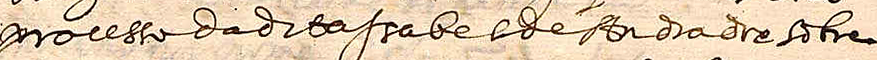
processo da dita Jsabel de Andradre sobre
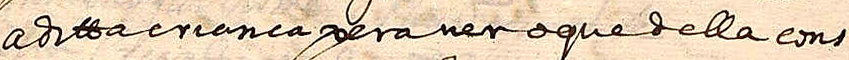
a ditta crianca pera uer o que della cons
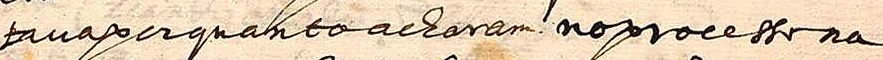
taua porquanto acharam no processo na
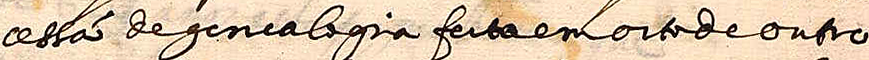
cessaõ de genealogia feita em oito de outro
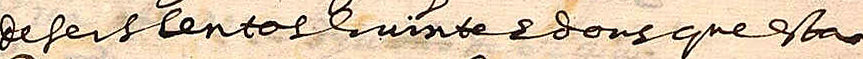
de seiscentos E uinte E dous que esta
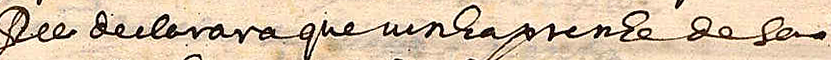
Ree declarara que uinha prenhe de seu
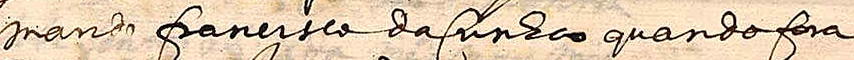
marido francisco da Cunha quando fora
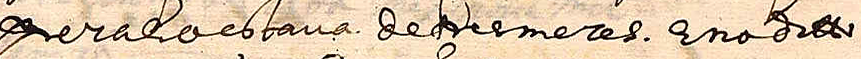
preza E o estaua de tres mezes. E no ditto
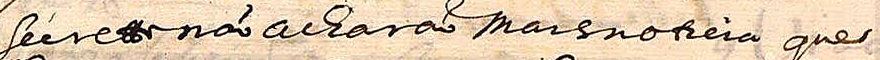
secretto naõ acharaõ mais noticia que
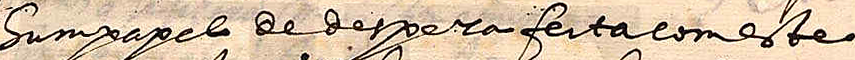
hum papel de despeza feita com este
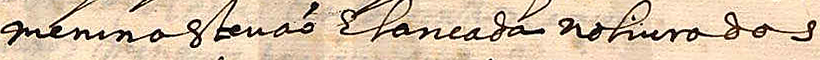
menino steuaõ E lancada no liuro dos
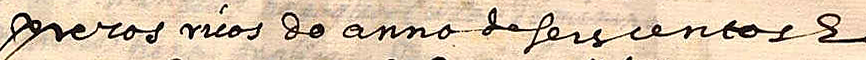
prezos ricos do anno de seiscentos E
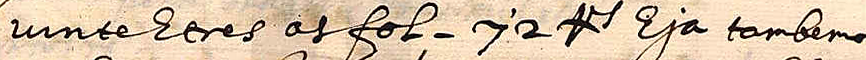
uinte E tres as fol - 72 V̶s E ja tambem
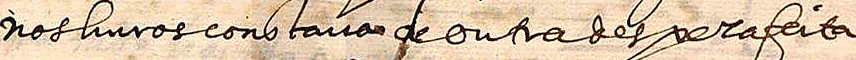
nos liuros constaua de outra despeza feita
